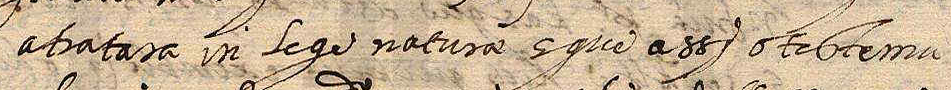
a tratara in lege naturæ E que assj o testemu
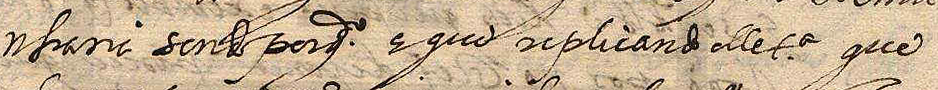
nharia sendo perg.do E que replicando elle t.a que
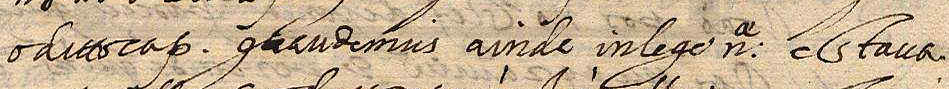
o ditto cap. guaudemus ainde in lege n:æ estaua
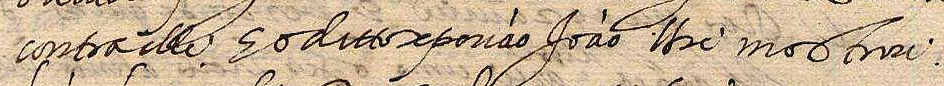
contra elle E o ditto xpouão João lhe mostrou.
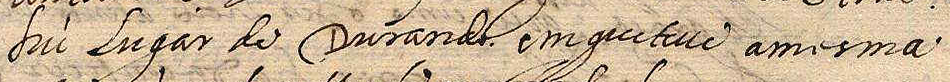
hū Lugar de Durando em que teue a mesma
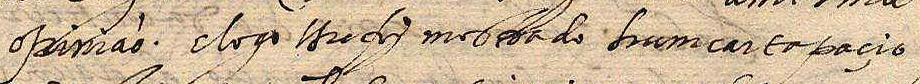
opinião. E logo lhe foy mostrado hum cartapaçio
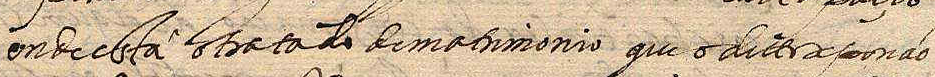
onde estâ o tratado de matrimonio que o ditto xpouão
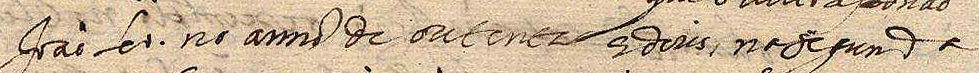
Joaõ leo. no annō de outenta E dous, na segunda
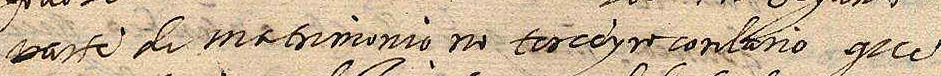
parte de matrimonio no terceyro corolario que
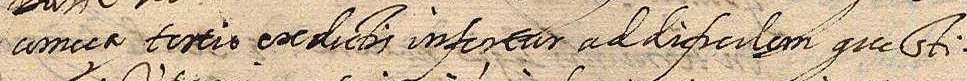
começa tertio ex dictis infortur ad difrulem ques̄ti
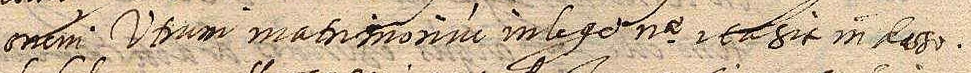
onem. Vtrum matrimoniū in lege næ. ita sit in dasso.
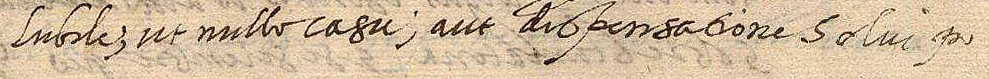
lubiles ut nullo casu; aut dispensatione solui po
